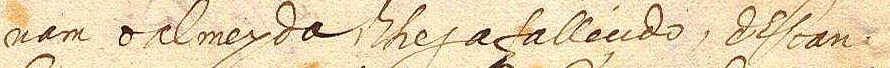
uam o almeyda, E he ja falleçido, & Estan
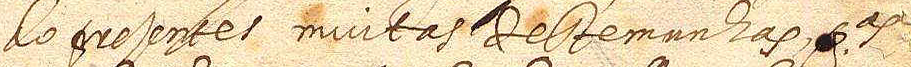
do presentes muitas testemunhas, p.as
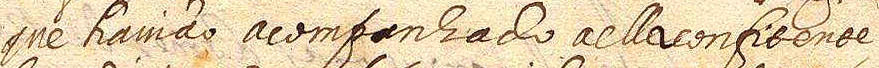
que hauião acompanhado a ella confitente,
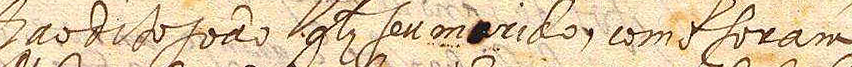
E ao dito João gl̄z seu marido, como foram
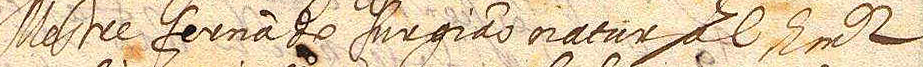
Mestre fernādo surgião natural, E mor
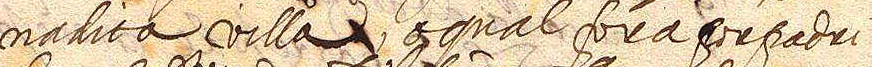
na dita villa, o qual fora por padri
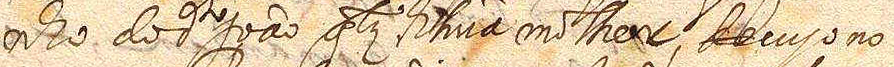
nho do dto João gl̄z E huā molher, de cujo no
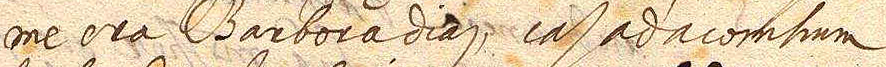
me era Barbora dias, casada com hum
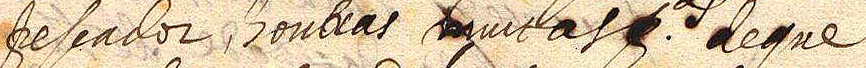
pescador, E outras muitas p.as de que
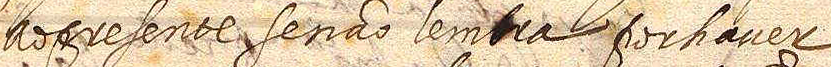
ao presente se não lembra por hauer
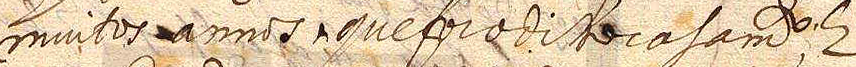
muitos annos que foi o dito casamto., E
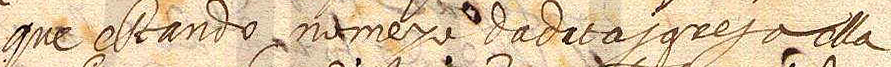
que estando no meyo da dita jgreja ella
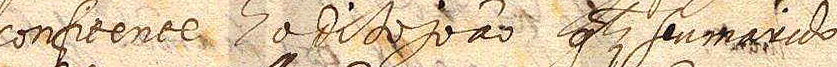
confitente E o dito joão gl̄z seu marido
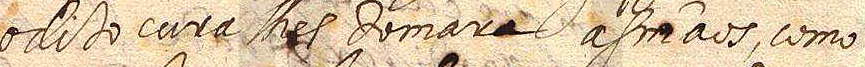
o dito cura lhes tomara as mãos, como
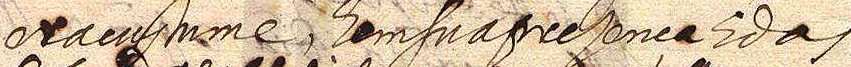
era custume, E em sua presença E das
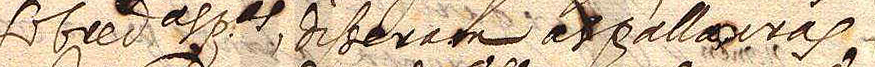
sobredas p.as, disseram as pallauras
